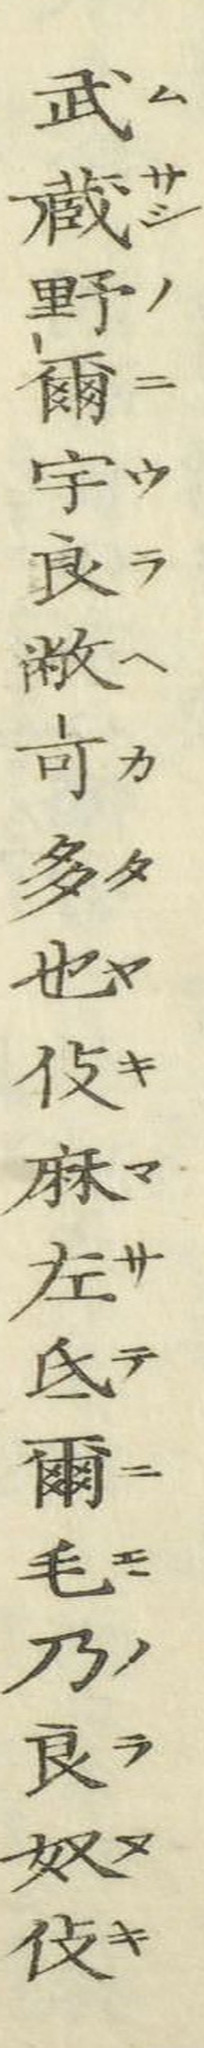武蔵野-尓宇良敝-可多也伎麻左氐尓毛乃良奴伎
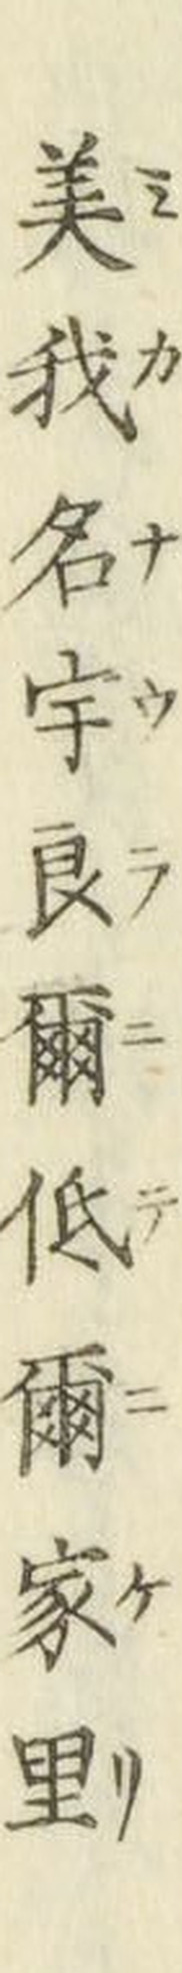美我名宇良尓低尓家里
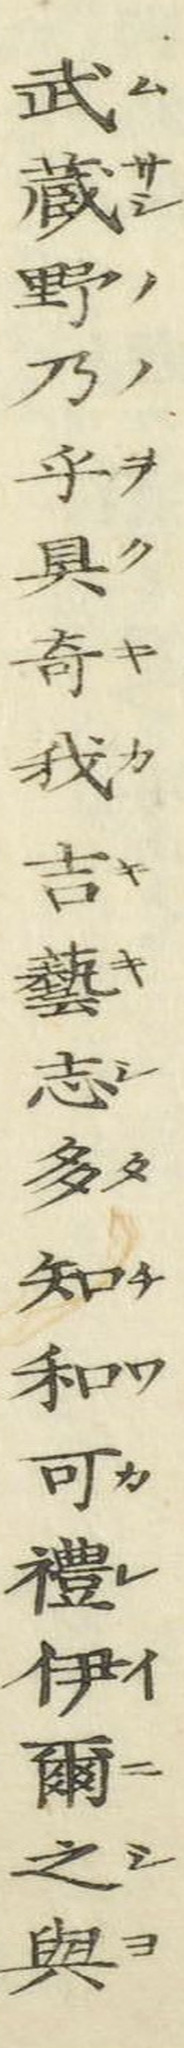武蔵野乃乎具奇我吉芸志多知和可礼伊尓之与
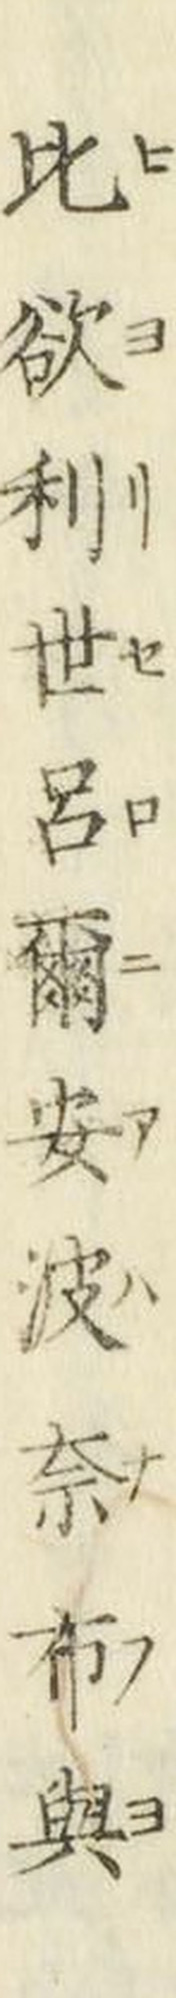比欲利世呂尓安波奈布与
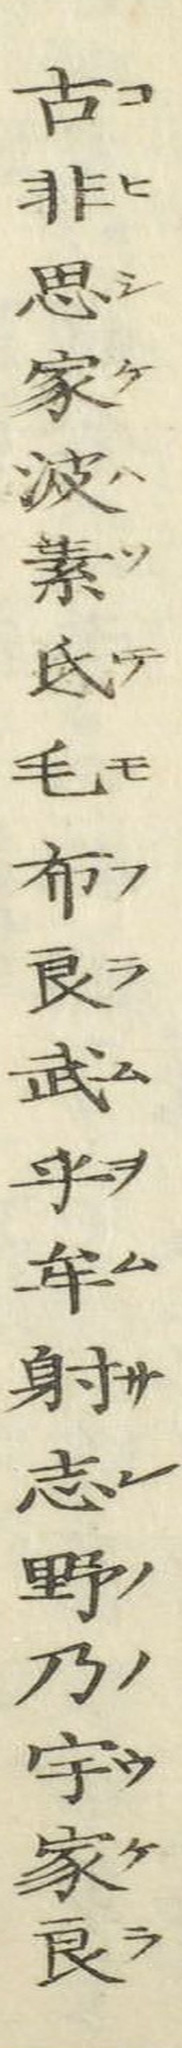古非思家波素氐毛布良武乎牟射志野乃宇家良
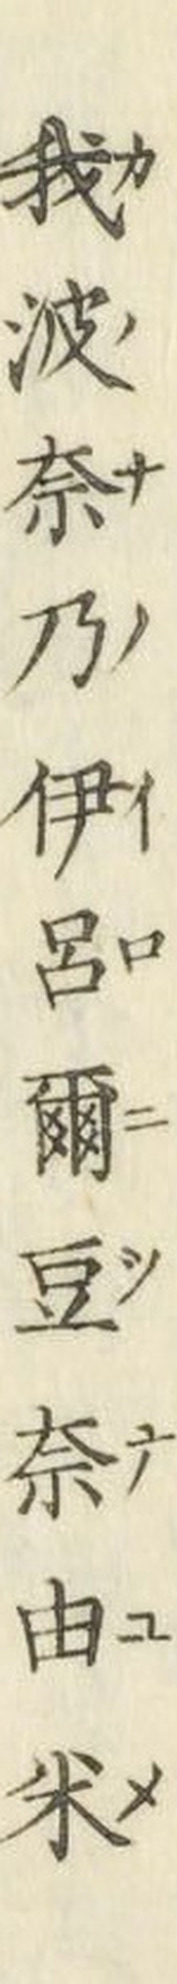我波奈乃伊呂尓豆奈由米
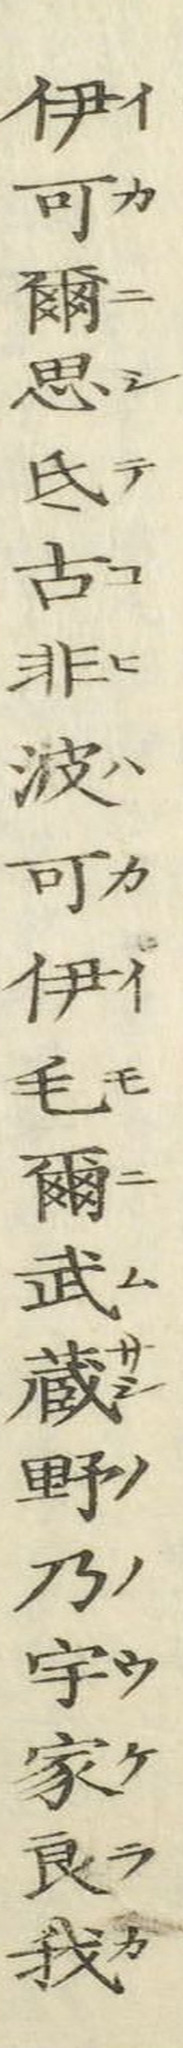伊可尓思氐古非波可伊毛尓武蔵野乃宇家良我
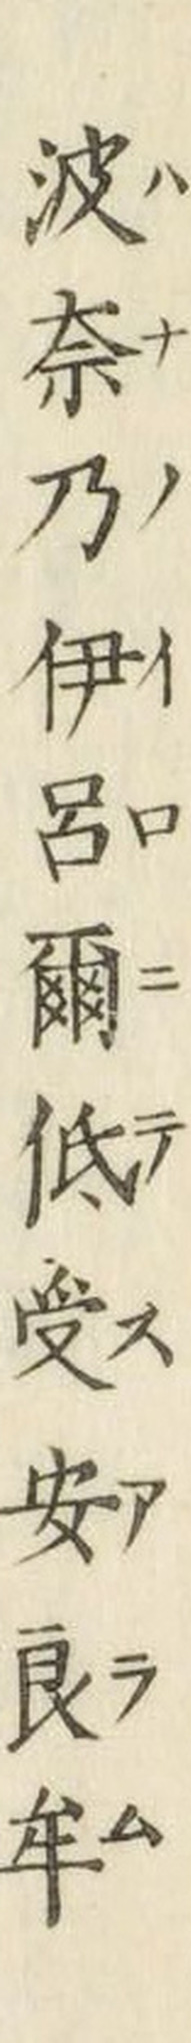波奈乃伊呂尓低受安良牟
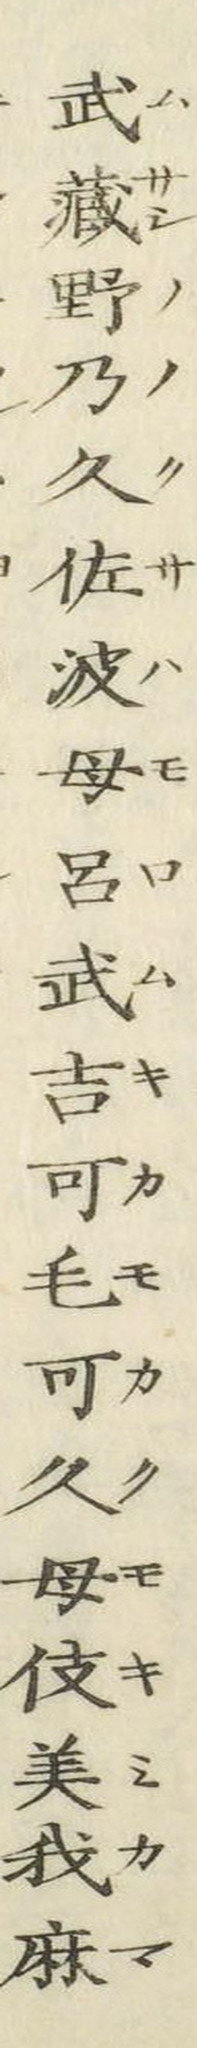武蔵野乃久佐波母呂武吉可毛可久母伎美我麻
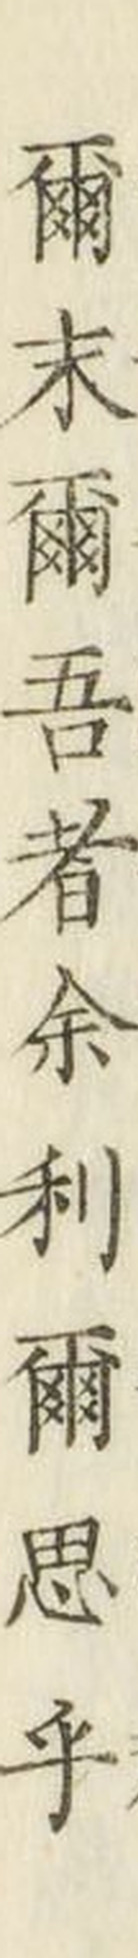尓末尓吾者余利尓思乎
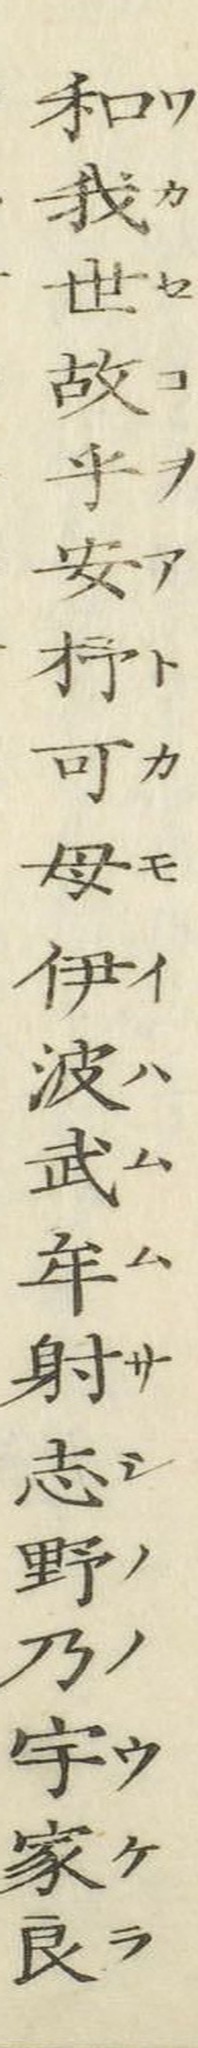和我世故乎安杼可母伊波武牟射志野乃宇家良
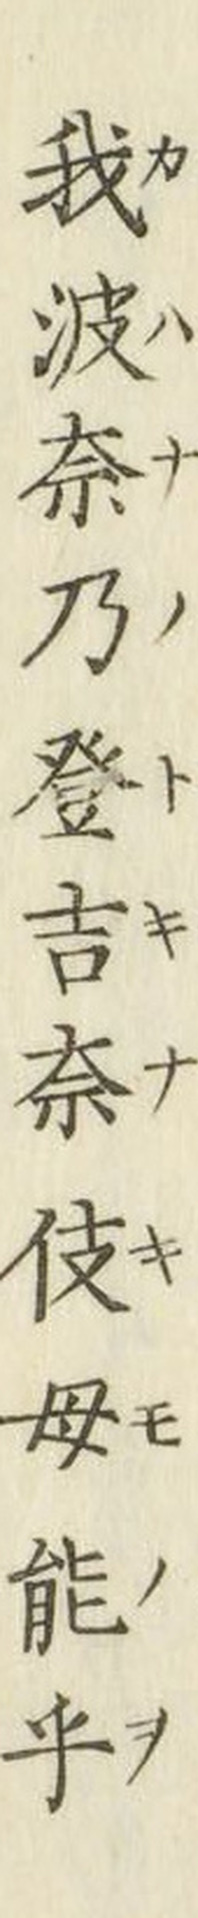我波奈乃登吉奈伎母能乎
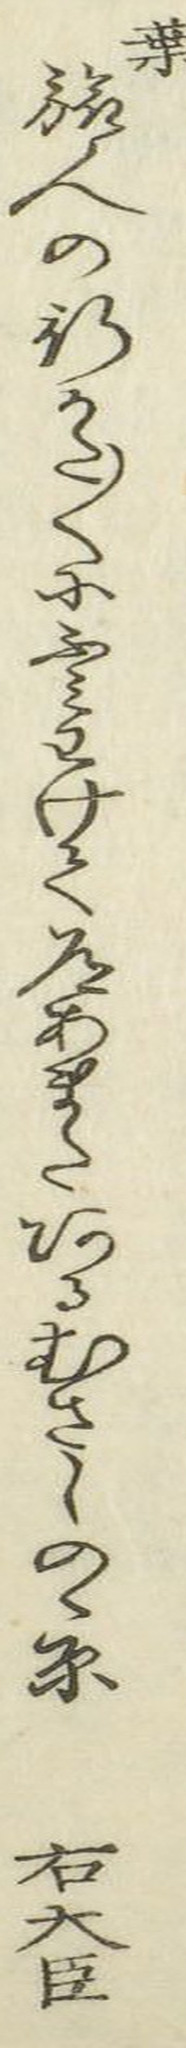玉葉旅人の行かた〳〵にふみわけて道あまたあるむさしのゝ原右大臣

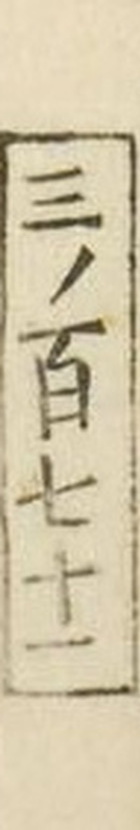三ノ百七十一
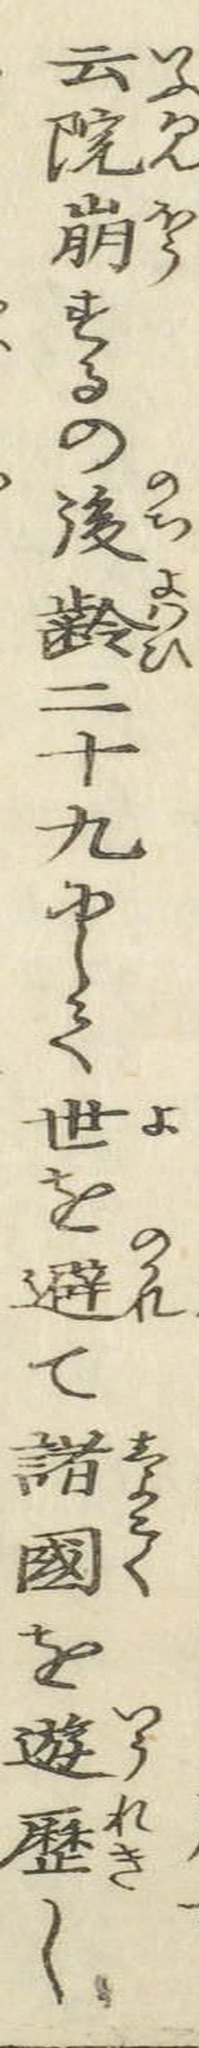云院崩するの後齢二十九にして世を避て諸国を遊歴し
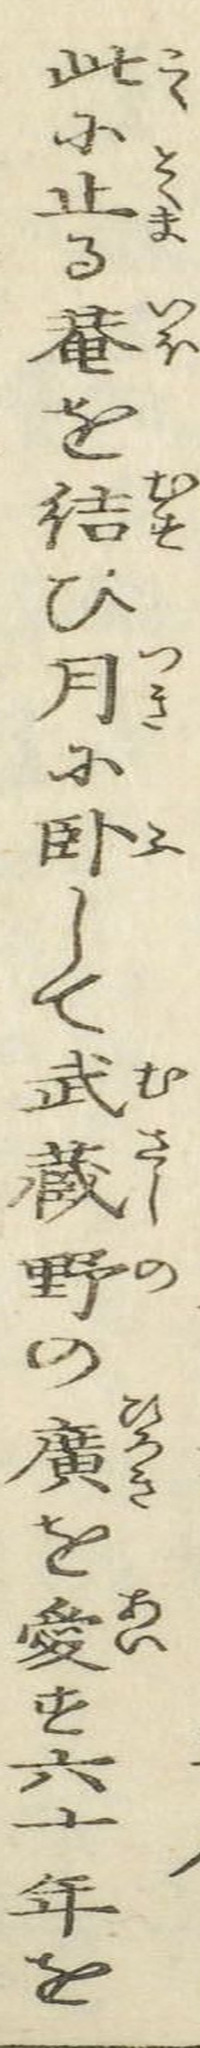此に止る庵を結ひ月に臥して武蔵野の広を愛す六十年を
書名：江戸名所図会 20巻 巻之9
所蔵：東京学芸大学教育コンテンツアーカイブ
